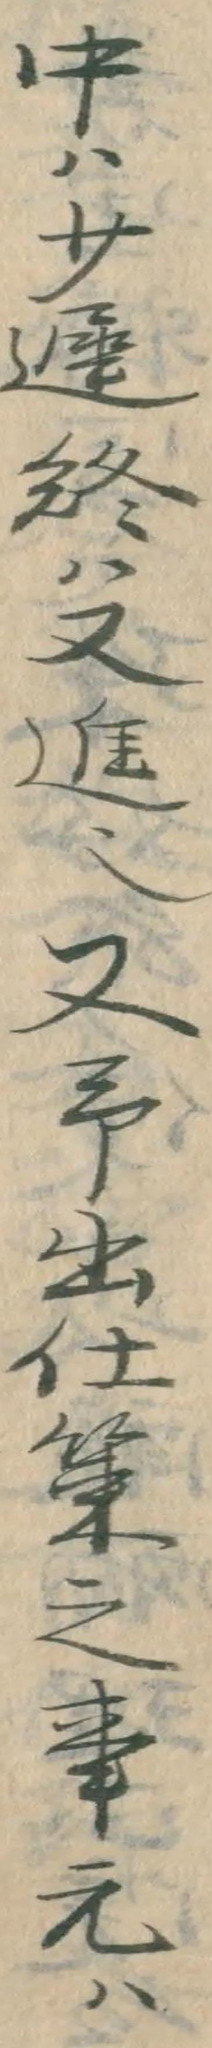中ハ少遅終ハ又進也又予出仕策之事元ハ
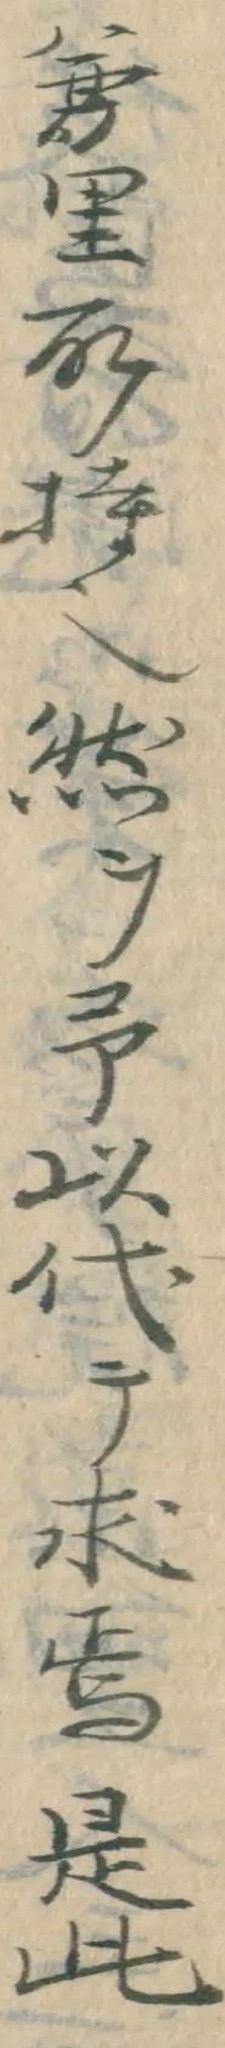兼里取持之然ヲ予以代テ求焉是此

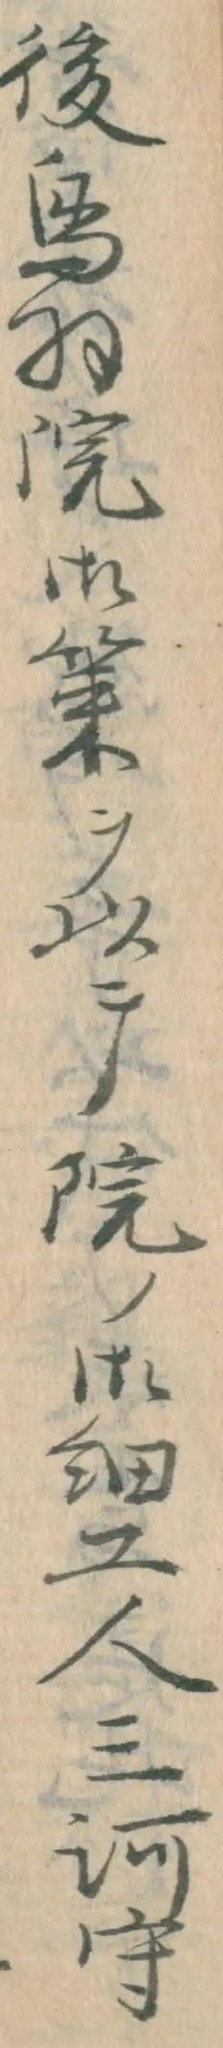後鳥羽院御策ヲ以テ院ノ御細工人三河守
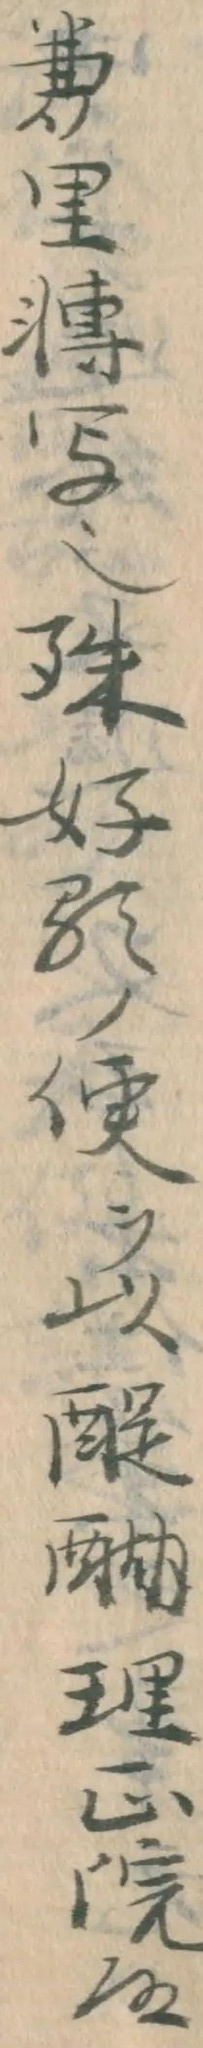兼里転写也殊好顕ノ便ヲ以醍醐理正院殿
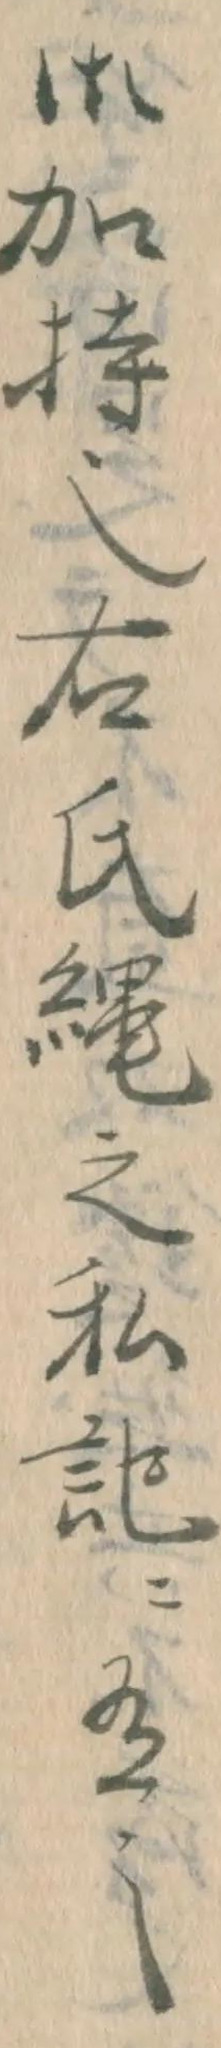御加持也右氏縄之私記ニ有之
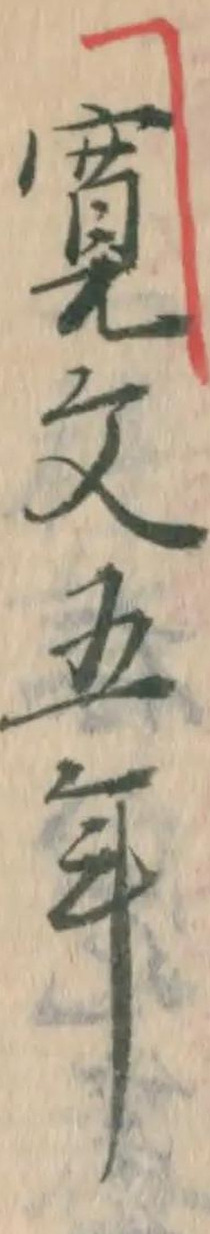寛文五年
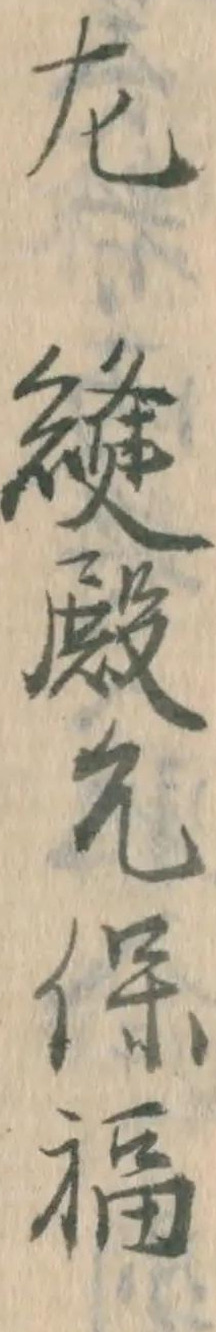左縫殿允保福
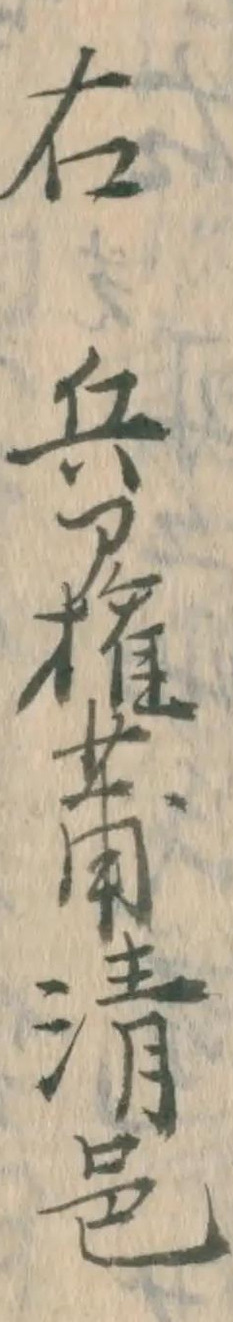右兵部権少輔清邑
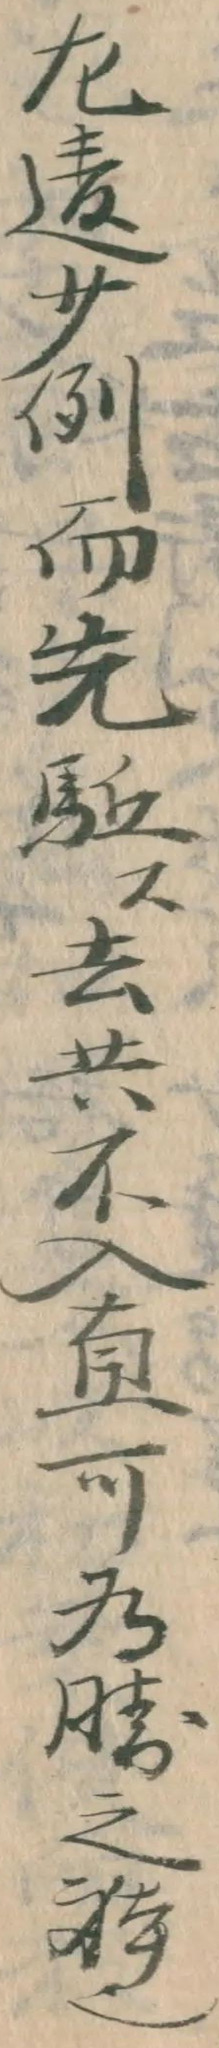左違少例而先駈ス去共不入直可為勝之躰也
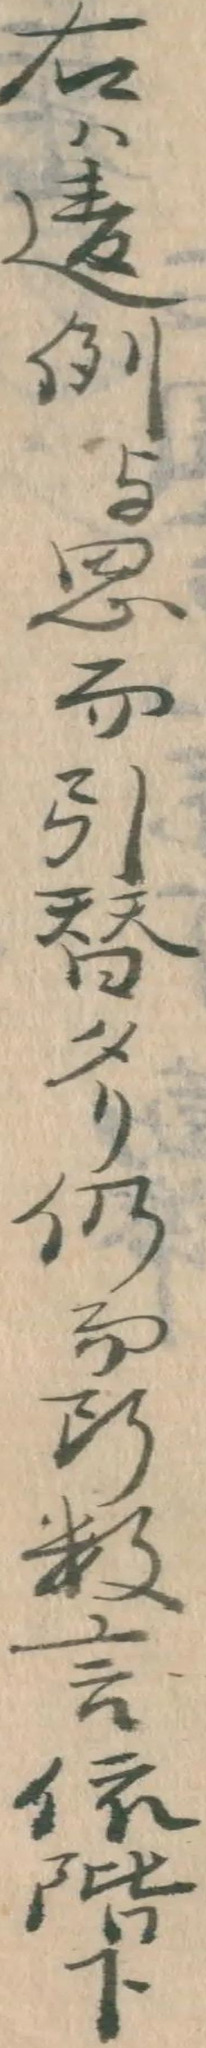右ハ違例与思而引替タリ仍而断数言依階下
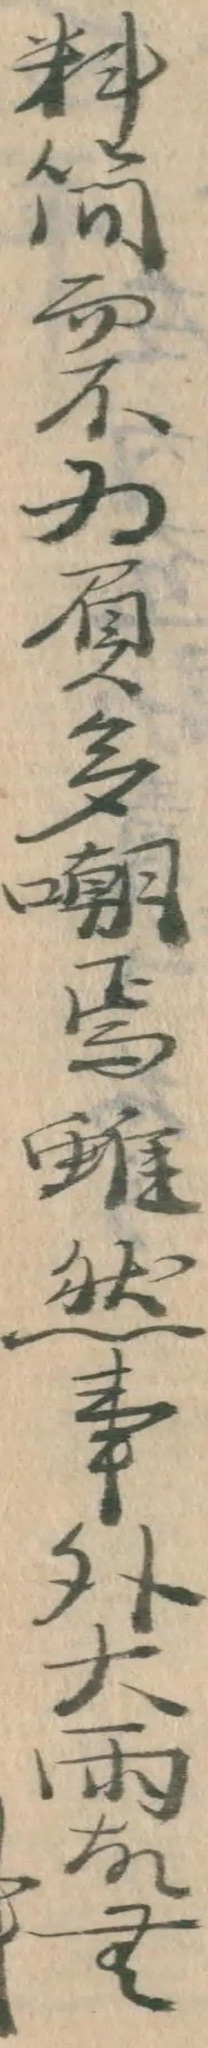料簡而不為負多嘲焉雖然事外大雨故無事
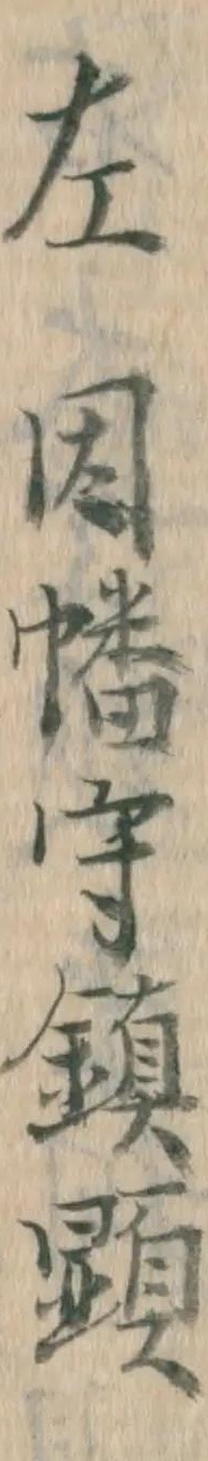左因幡守鎮顕
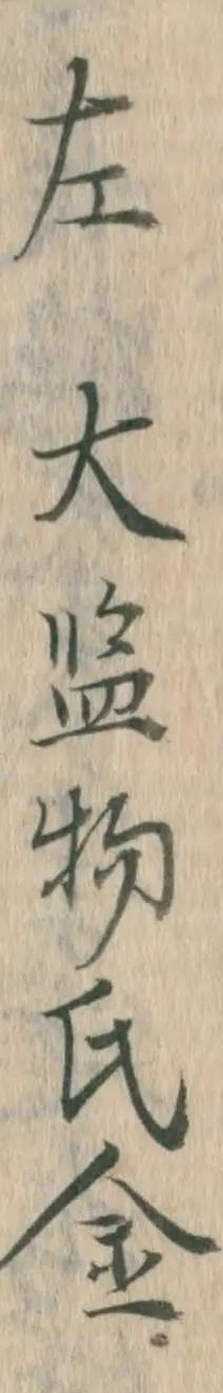左大監物氏金
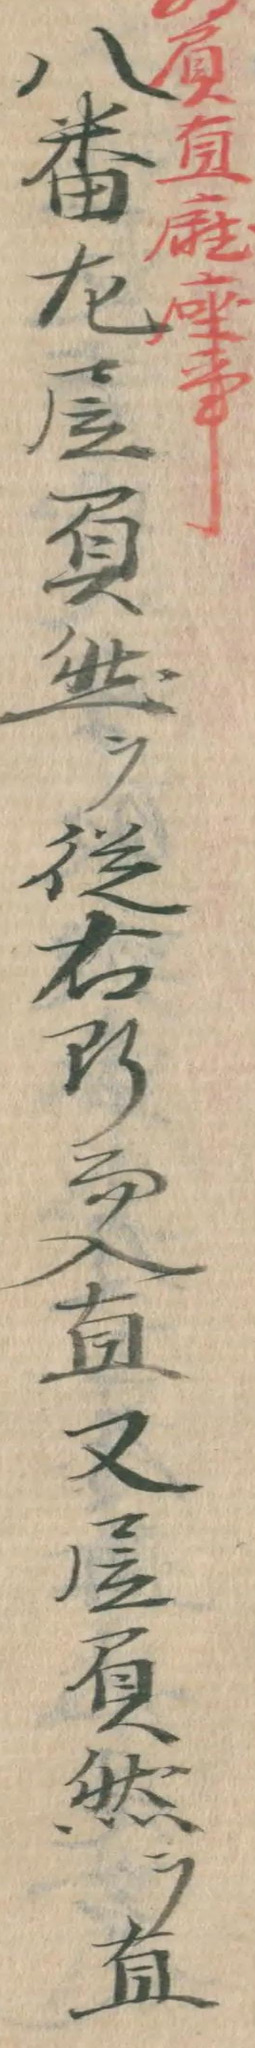八番左屋負然ヲ従右断而入直又屋負然ヲ直
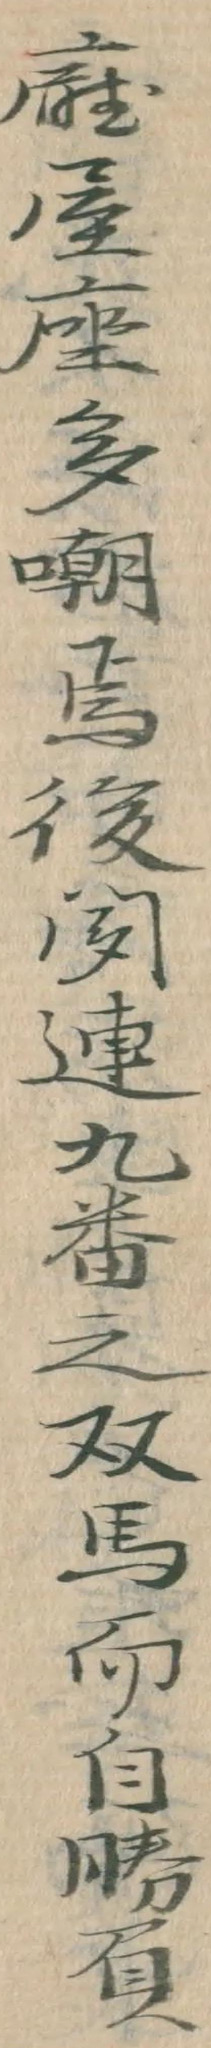庁屋座多嘲焉後聞連九番之双馬而自勝負
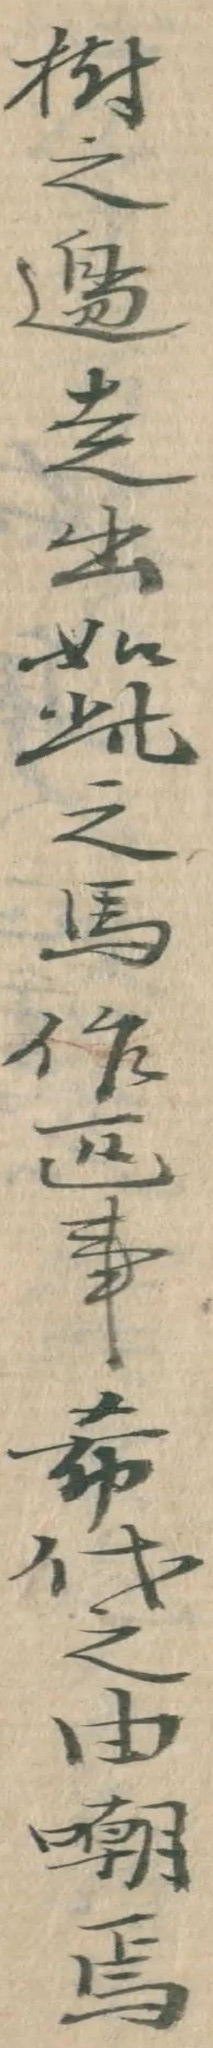樹之辺走出如此之馬作匹事希代之由嘲焉
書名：賀茂社記録. 第10冊
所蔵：国立国会図書館 National Diet Library, JAPAN
